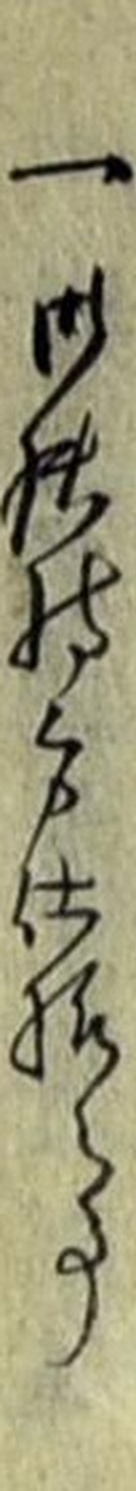一御扶持方仕様之事
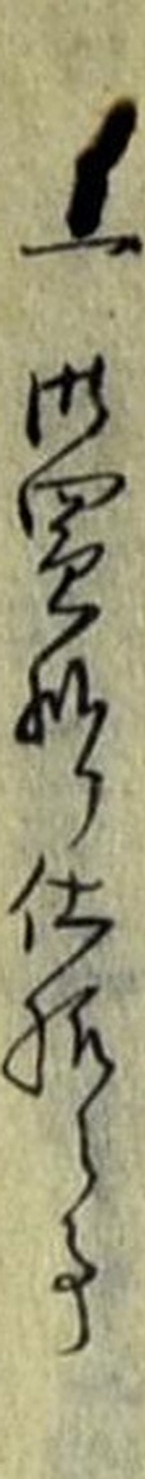一御買掛り仕様之事
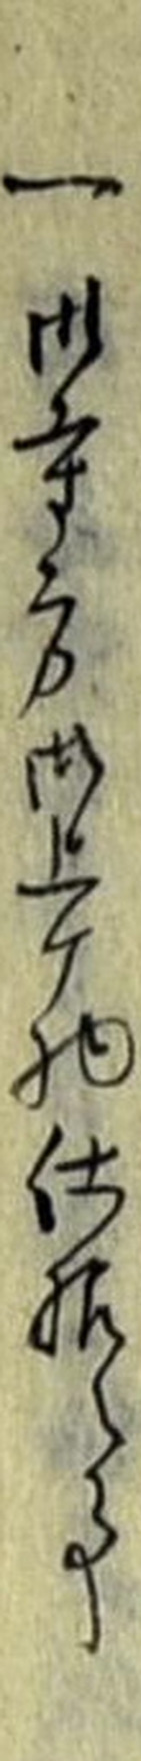一御寺方御上ヶ物仕様之事
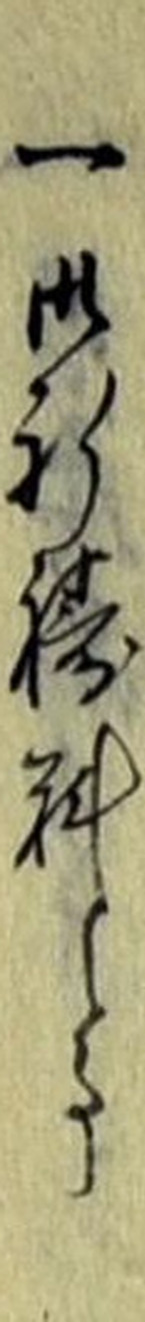一御祈祷料之事

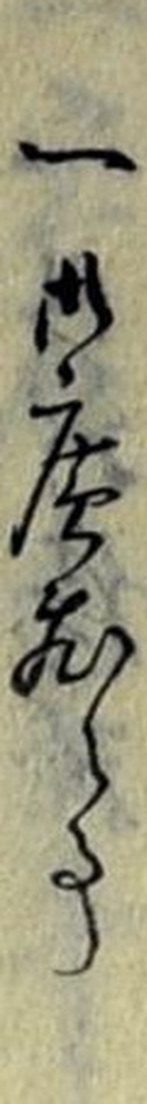一御広敷之事
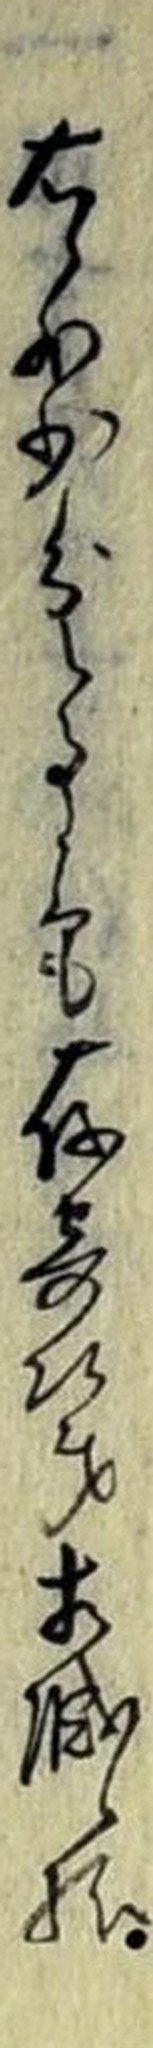右之外少分之事に而も存寄次第相減候様
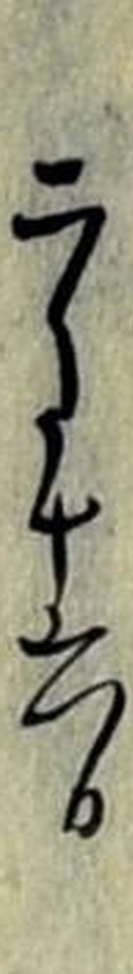二月十六日
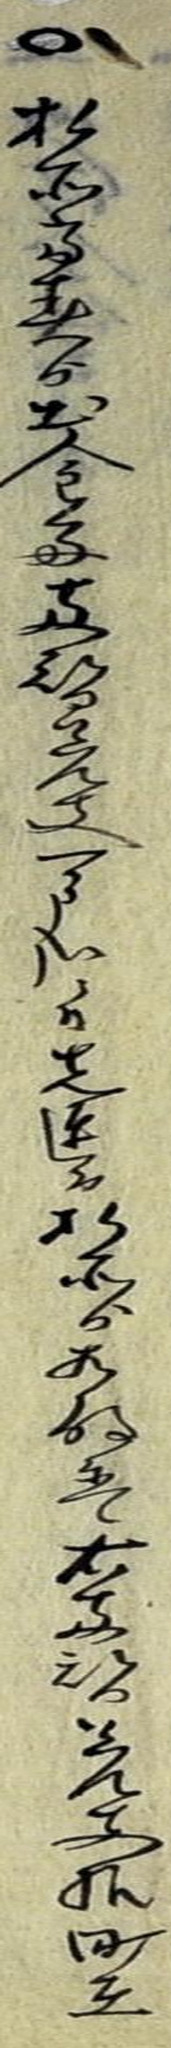〇札所当春ゟ出金多両替差支可申哉に付先達而札所ゟ相触置候右両替差支様町在
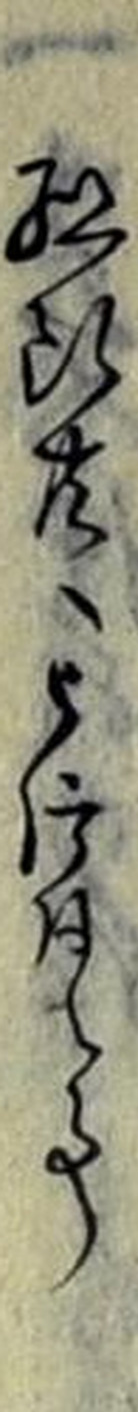組頭共へ被仰付候事
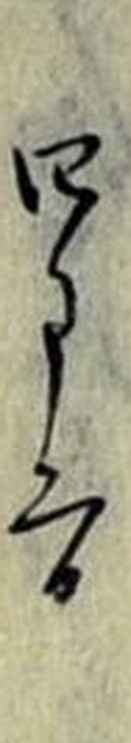四月二日
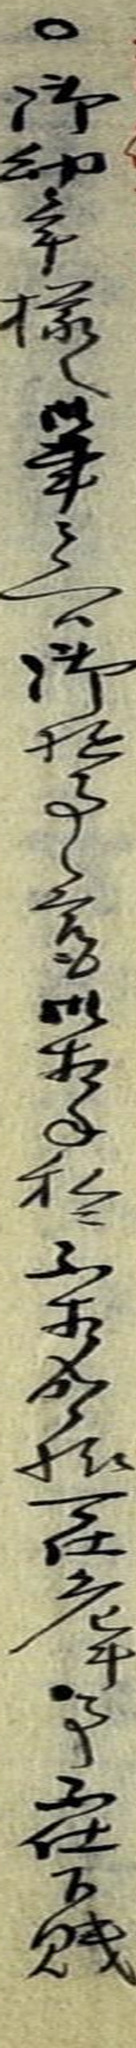〇御幼年様之御年に候へは御遊事之節も御相手私に不相成候様可仕危き事不仕下賤
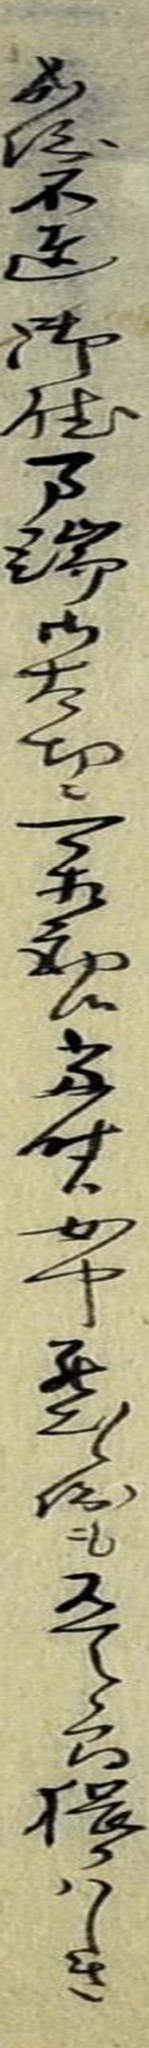成儀不達御徳万端御太切に可相勤候当時は女中罷出候儀も有之候間猥かはしき
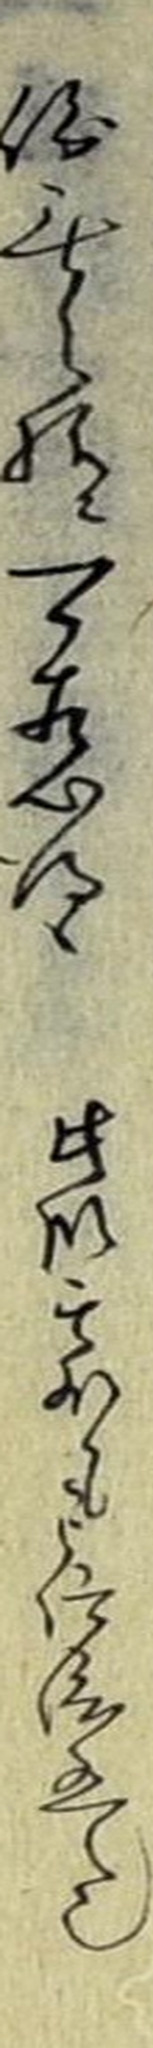儀無之様に可相心得候此段其外へも被仰渡有之也
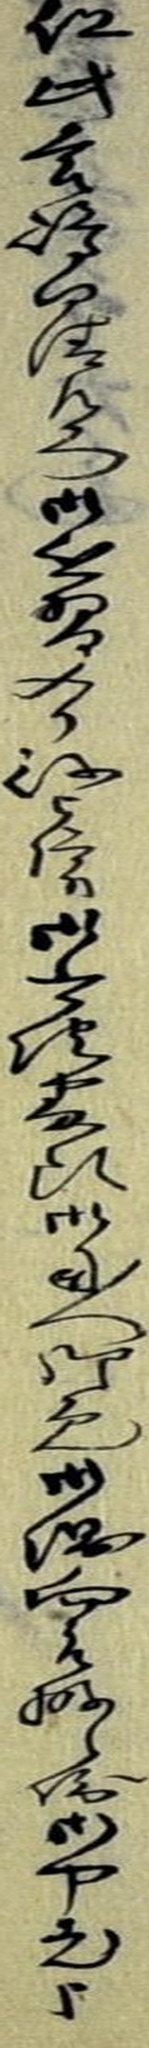但此節嶋田清左衛門御近習〆り役被仰付御書院番頭御用人御免御側向取扱之儀御中老申
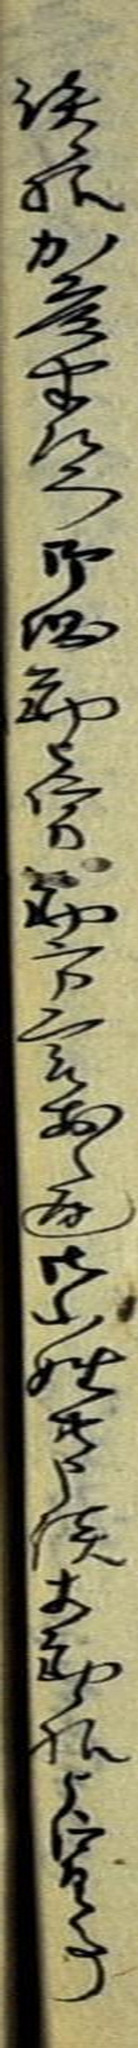談候様加藤半左衛門御側勤被仰付勤方最前之通御小姓共申談相勤様被仰付候事
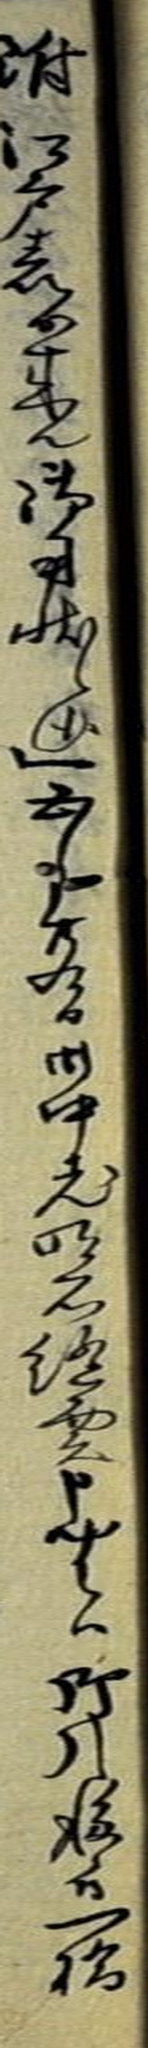附江戸表ゟ来る御用状之趣」五月廿五日御中老明石縫殿申聞候は御引移に付一橋
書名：命令之部 二
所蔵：福井県文書館 Fukui Prefectural Archives
